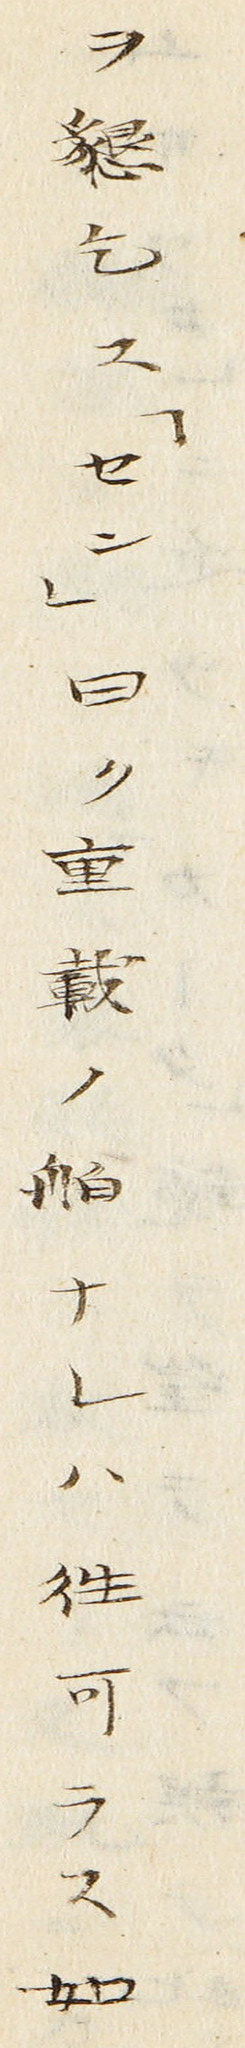ヲ懇乞ス「セン」曰ク重載ノ舶ナレハ往可ラス如
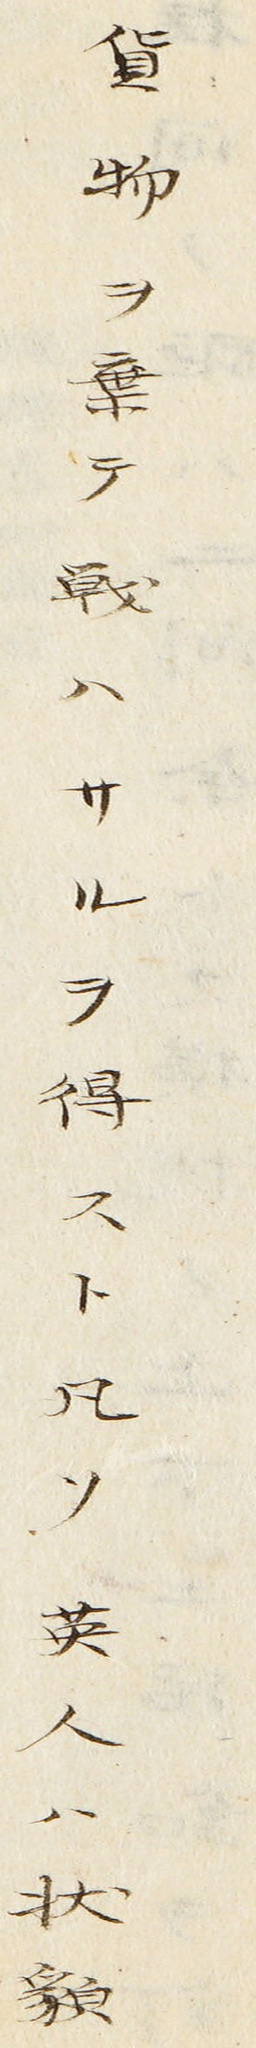貨物ヲ棄テ戦ハサルヲ得スト凡ソ英人ハ状貌
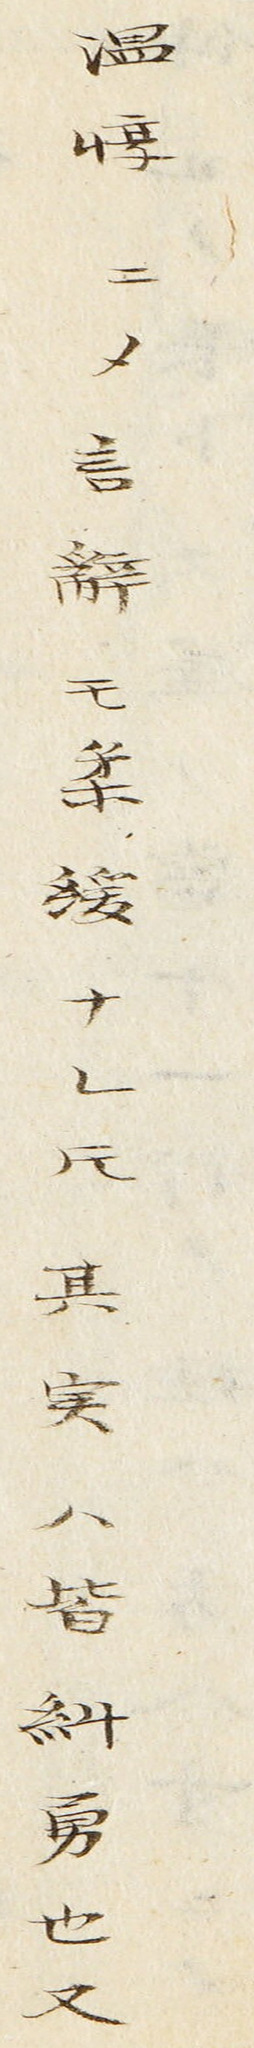温惇ニシテ言辞モ柔緩ナレトモ其実ハ皆糾勇也又
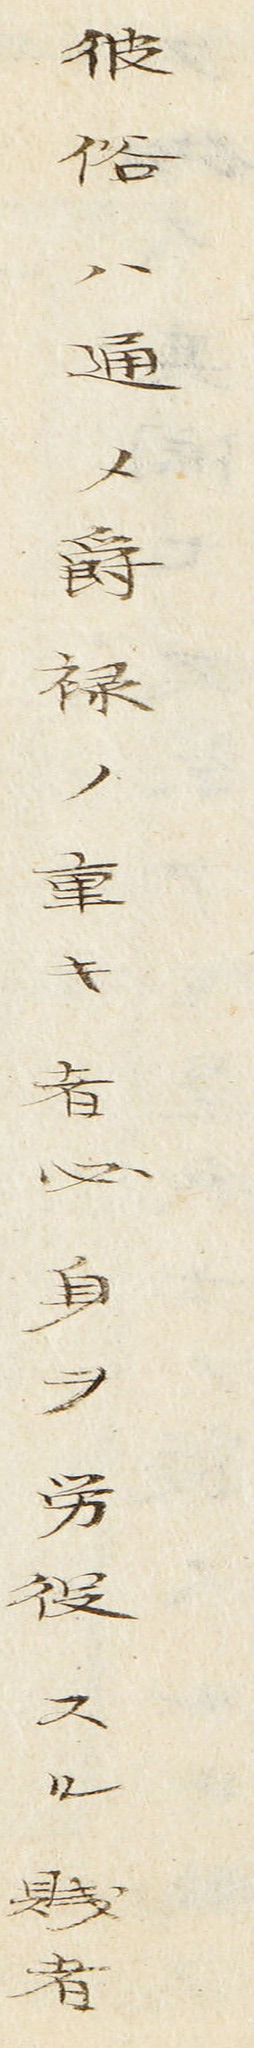彼俗ハ通シテ爵禄ノ重キ者必身ヲ労役スル賎者
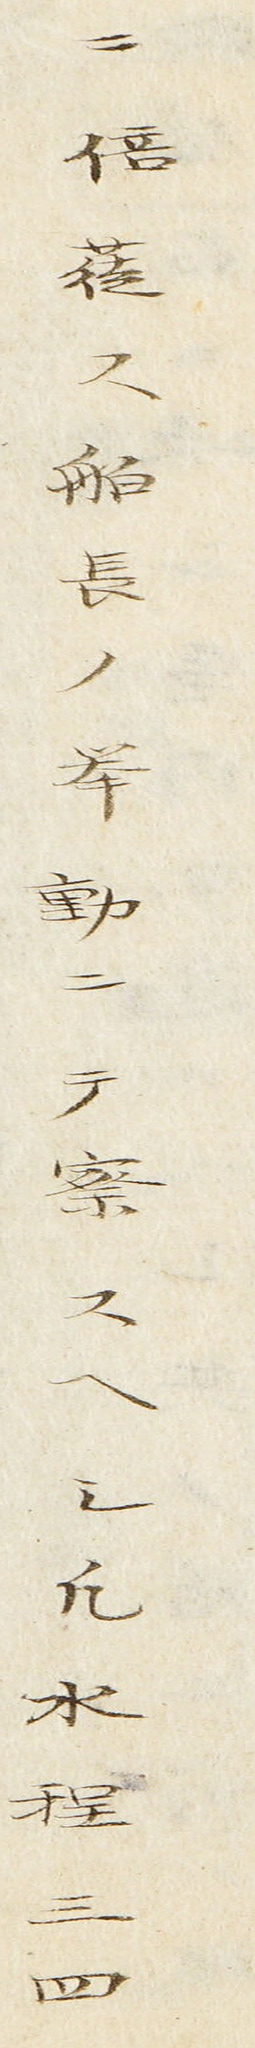ニ倍蓰ス舶長ノ挙動ニテ察スヘシ凡水程三四
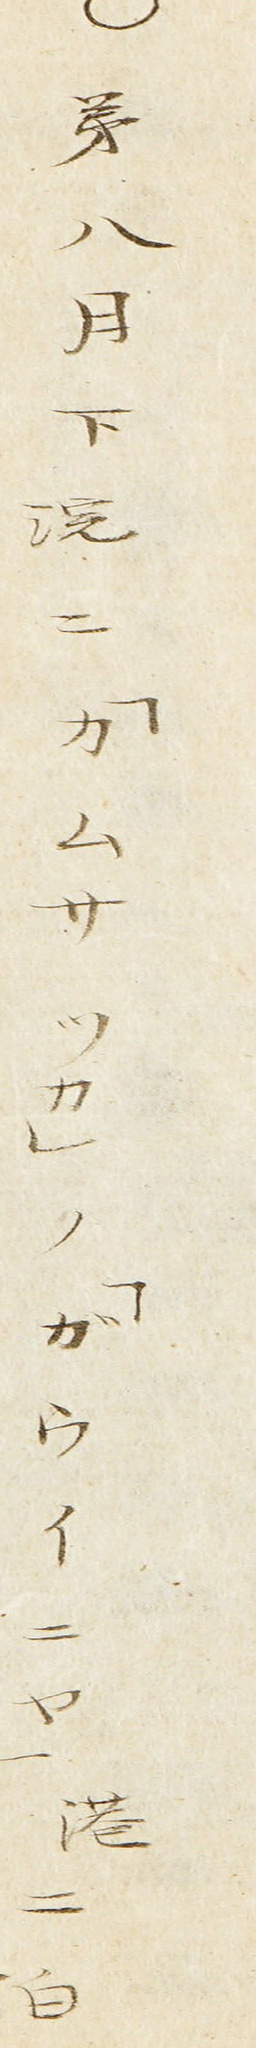○第八月下浣ニ「カムサツカ」ノ「ガウイニヤ」港ニ泊
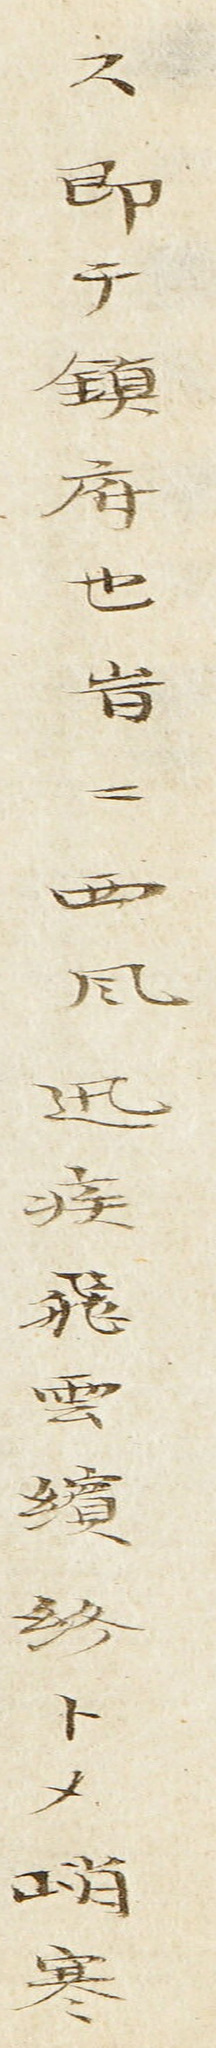ス即チ鎮府也旹ニ西風迅疾飛雲繽終トシテ峭寒
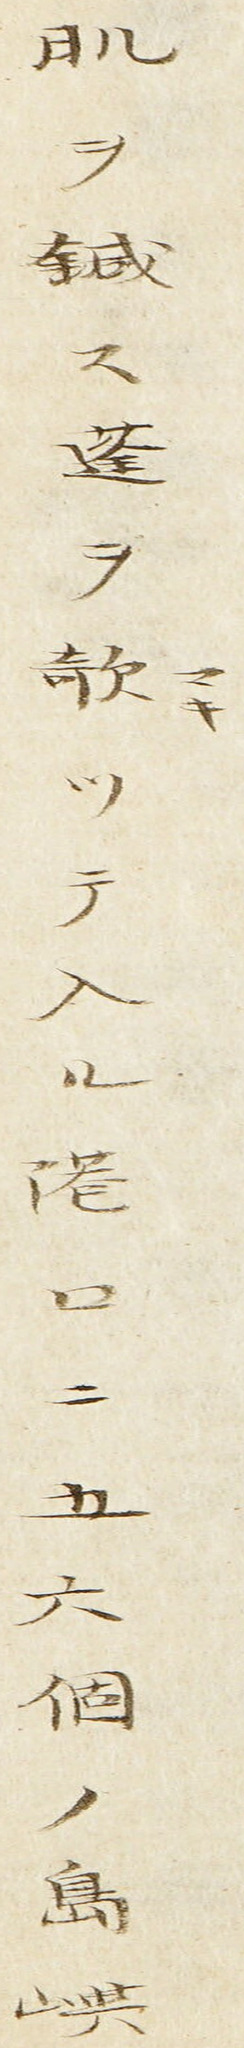肌ヲ鍼ス蓬ヲ欹ツテ入ル港口ニ五六個ノ島嶼

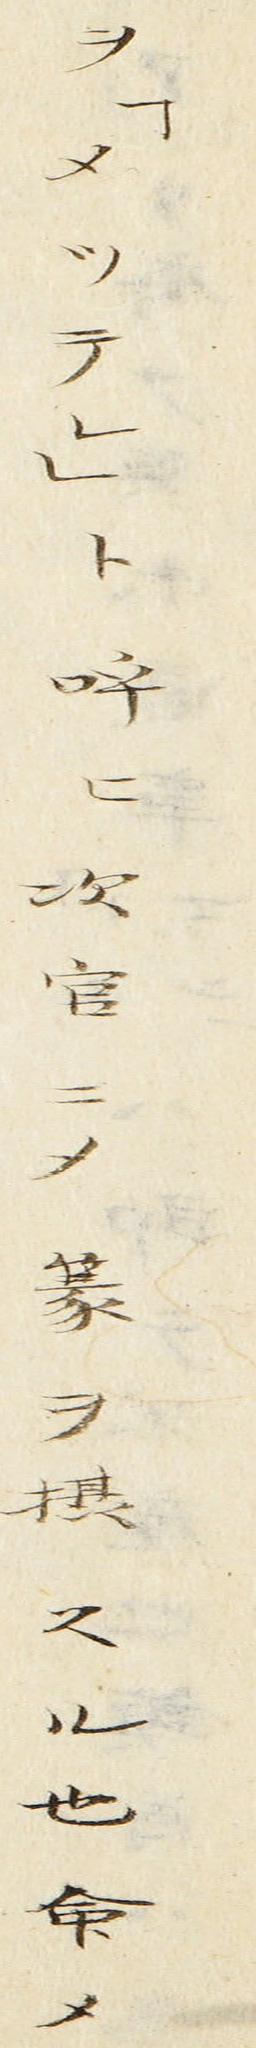ヲ「メツテレ」ト呼ヒ次官ニシテ篆ヲ摂スル也命シテ
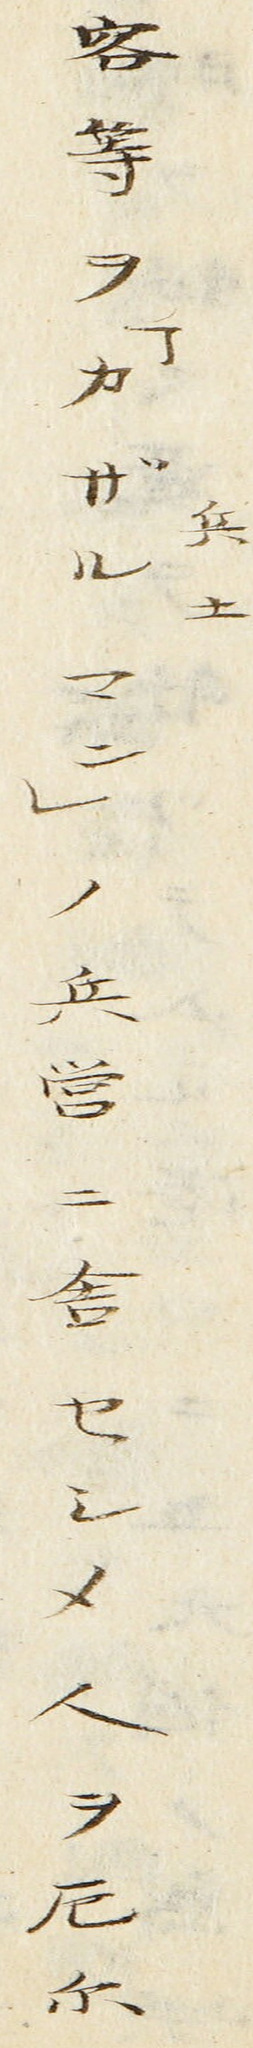客等ヲ「カザルマン」ノ兵営ニ舎セシメ人ヲ厄尓
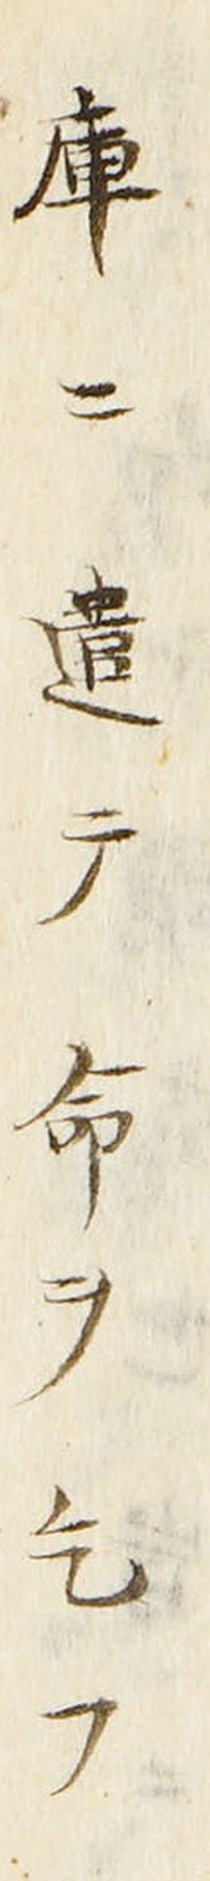庫ニ遣テ命ヲ乞フ
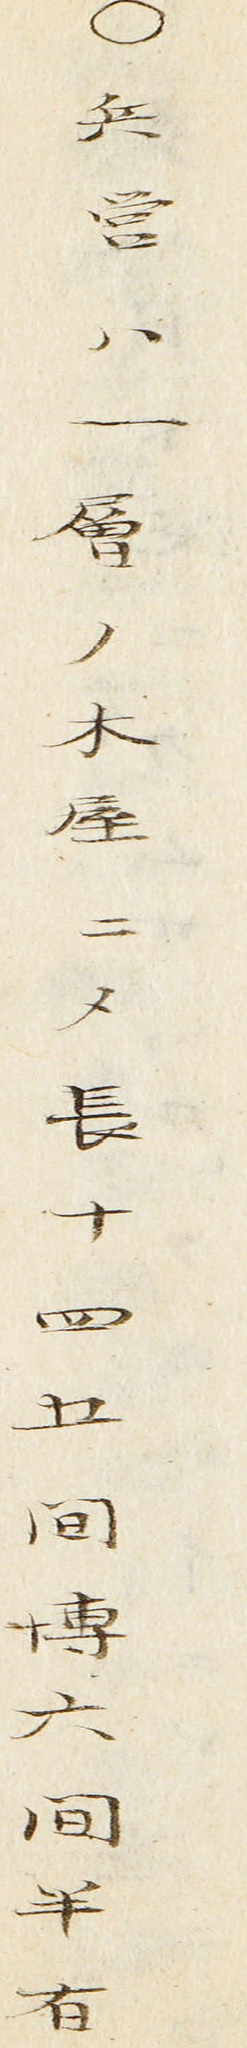○兵営ハ一層ノ木屋ニシテ長十四五間博六間半有
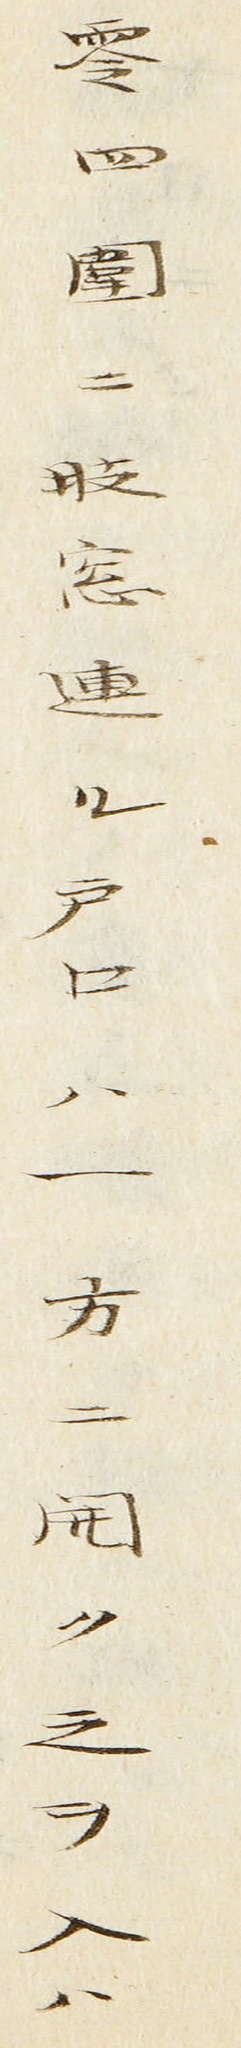零四囲ニ肢窓連ル戸口ハ一方ニ開ク之ヲ入ハ
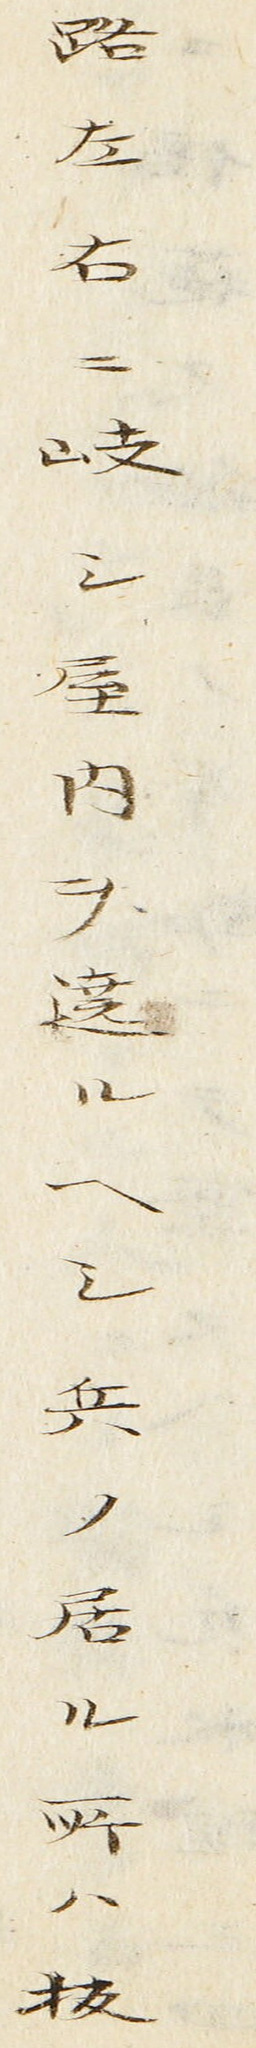路左右ニ岐シ屋内ヲ遶ルヘシ兵ノ居ル所ハ板
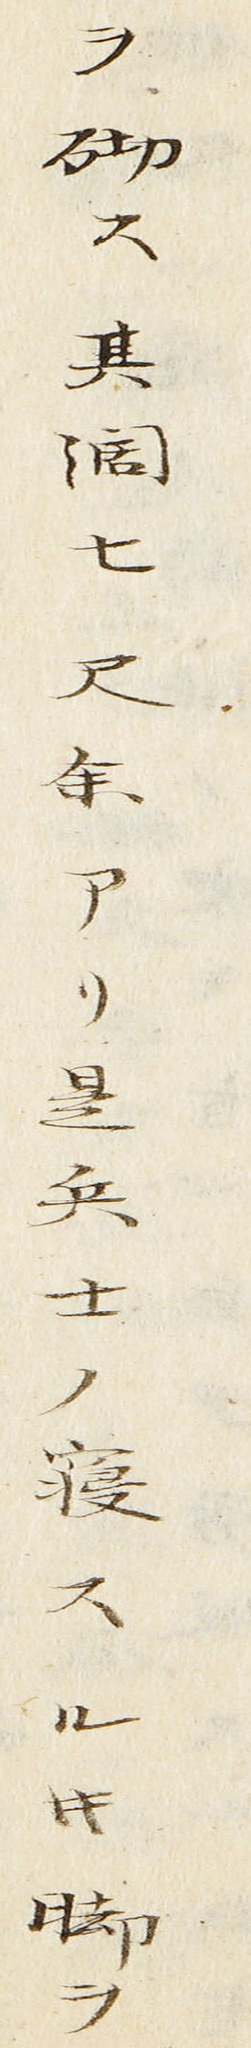ヲ砌ス其濶七尺余アリ是兵士ノ寝スルトキ脚ヲ
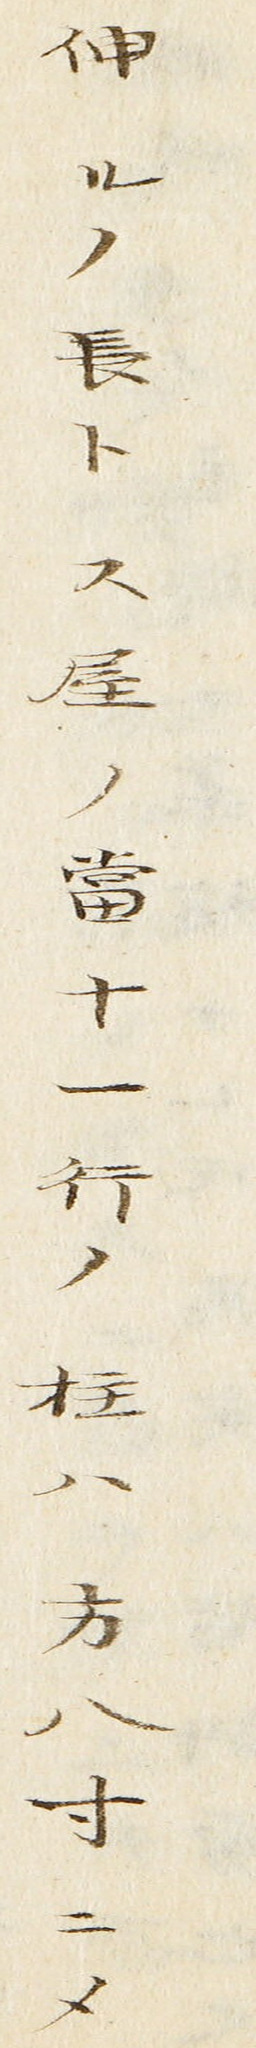伸ルノ長トス屋ノ当十一行ノ柱ハ方八寸ニシテ
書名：流蕃通書
